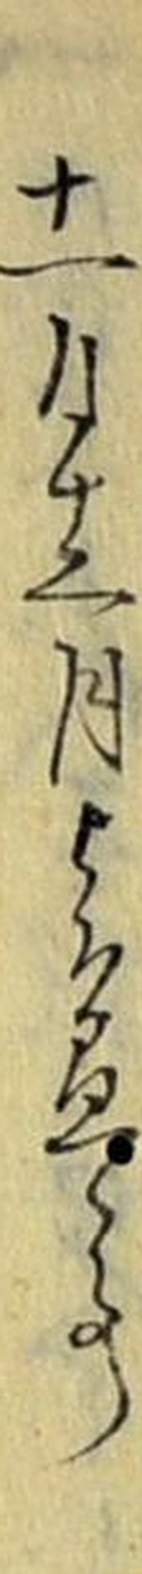十一月十二月被下置候事

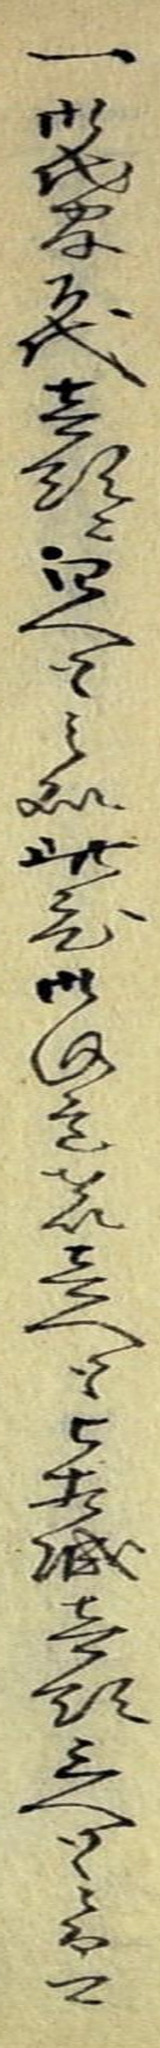一御代官下代壱領ニ四人ツヽ之処此度御趣意を以壱人ツヽ相減壱領三人ツヽニ而可
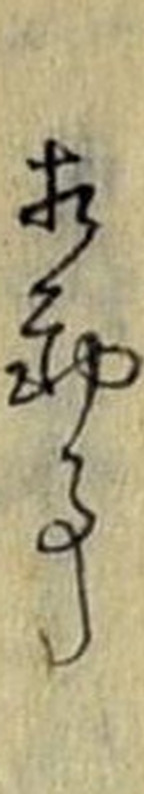相勤事
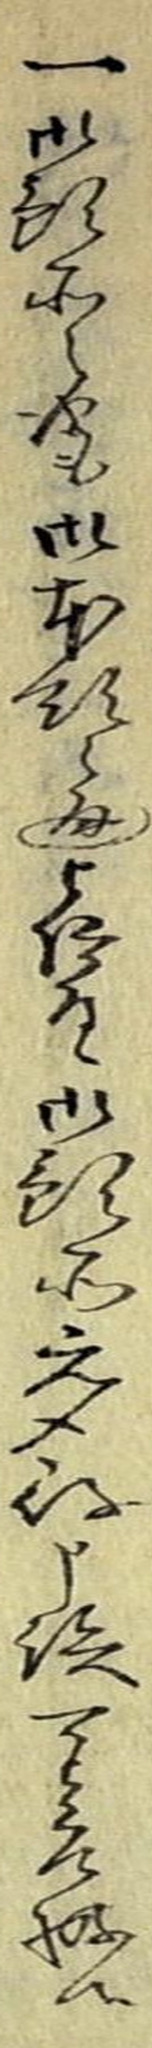一御預所之儀も御本領之通被仰付候御預所元〆役申談可被取扱候
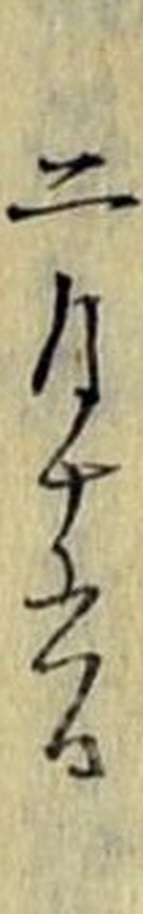二月十六日
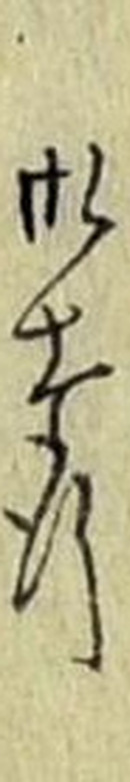御奉行
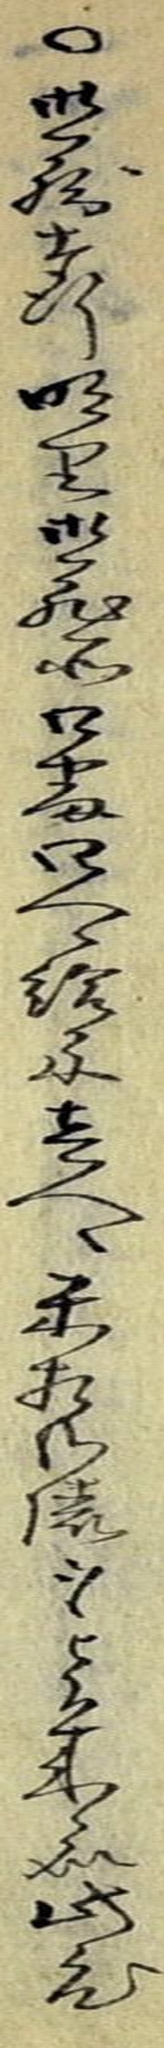〇御蔵奉行明里御蔵所口番四人へ給米壱人へ米拾弐俵ツヽ被下来候処此度
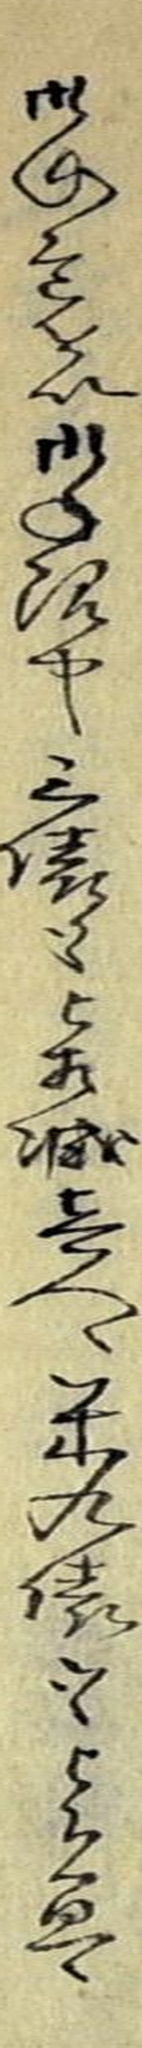御趣意を以御年限中三俵ツヽ被相減壱人へ米九俵ツヽ被下置候
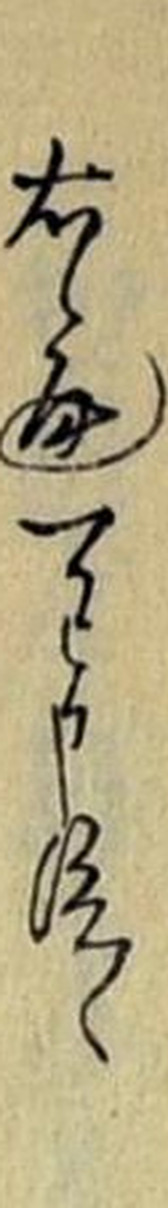右之通可被申渡候
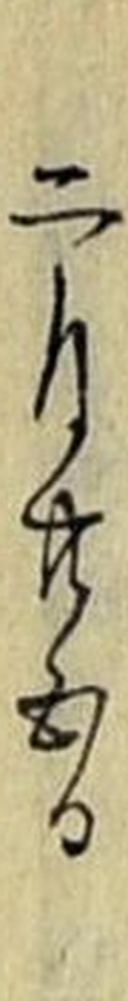二月廿五日
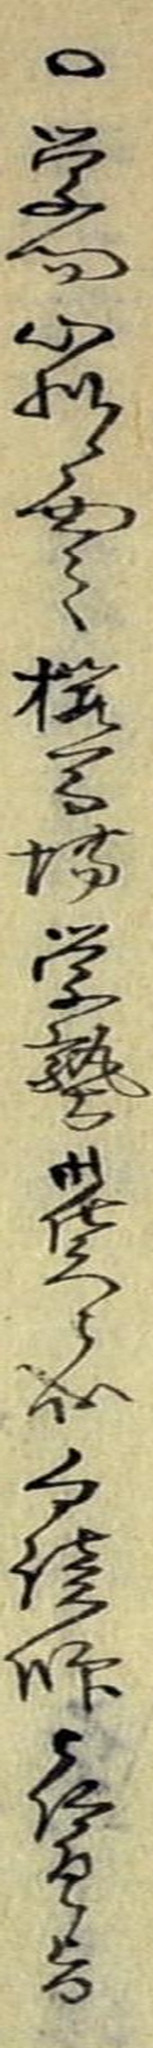〇学問心掛候面々桜馬場学塾御貸被成同講師被仰付候旨
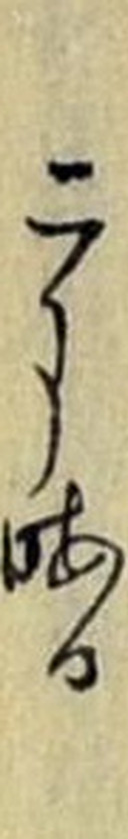二月晦日
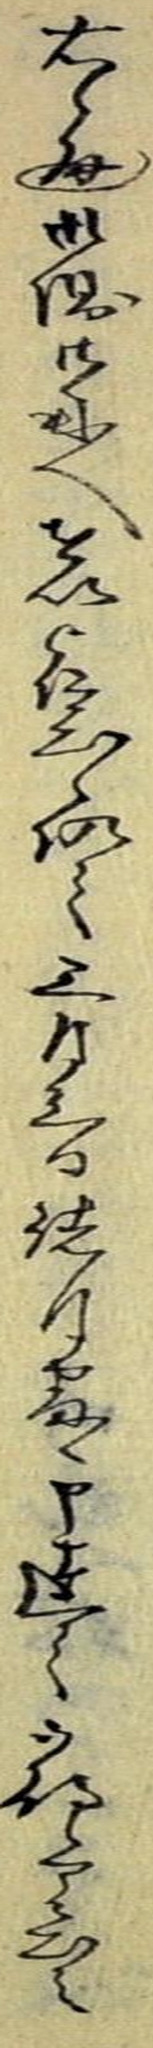右之通御側御用人を以被仰出候仍之三月三日諸月番へ申達之御触可被出之
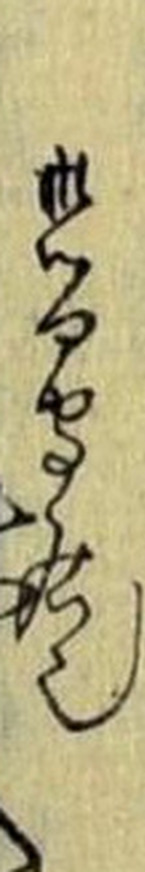御留守居也
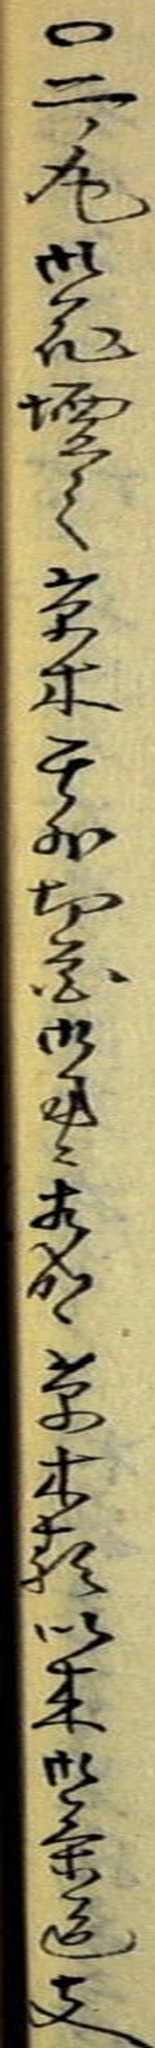〇二ノ丸御花壇之草木其外切花御用被相成候草木類以来御茶道支
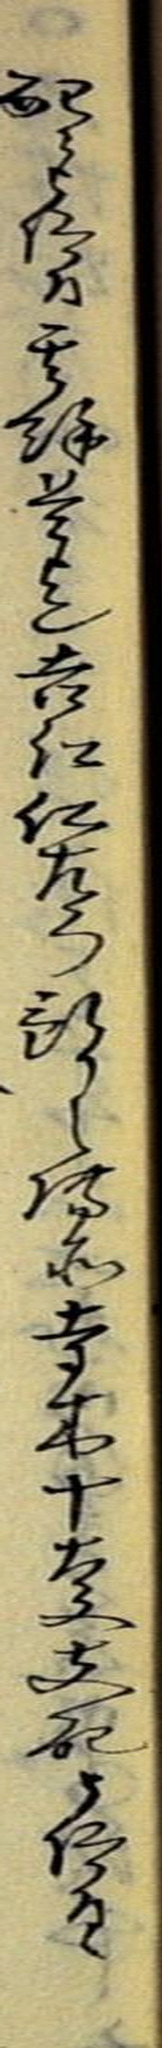配ニ被仰付其余是迄吉江仁左衛門預り之場所寺木十太夫支配被仰付候
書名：命令之部 五
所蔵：福井県文書館 Fukui Prefectural Archives
